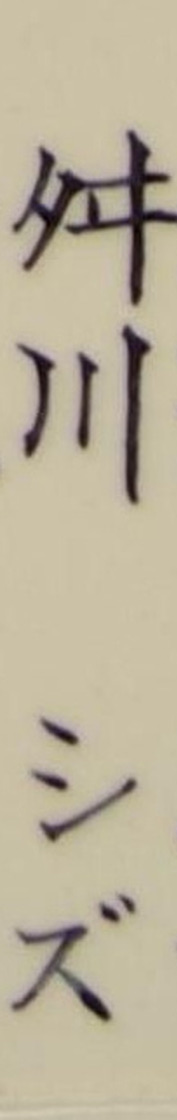舛川シズ
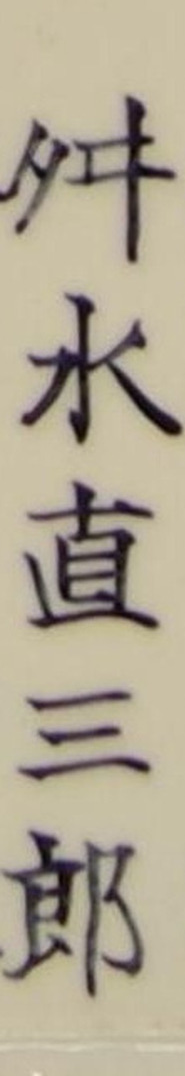舛水直三郎
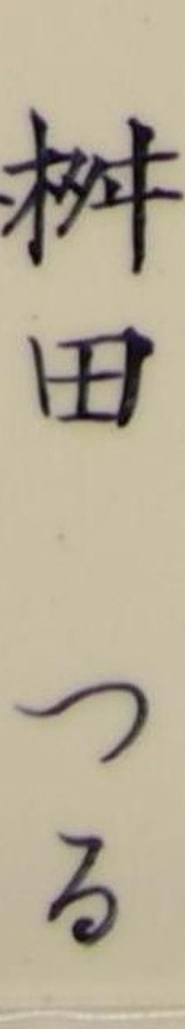桝田つる
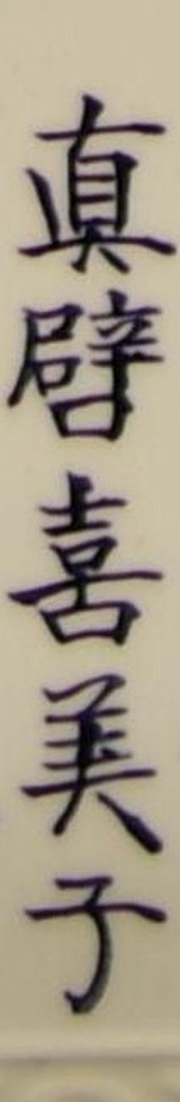真壁喜美子
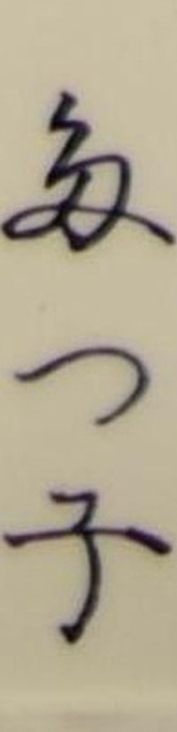たつ子
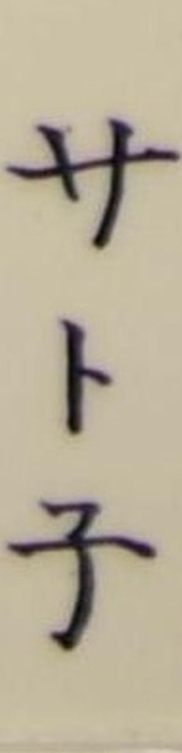サト子
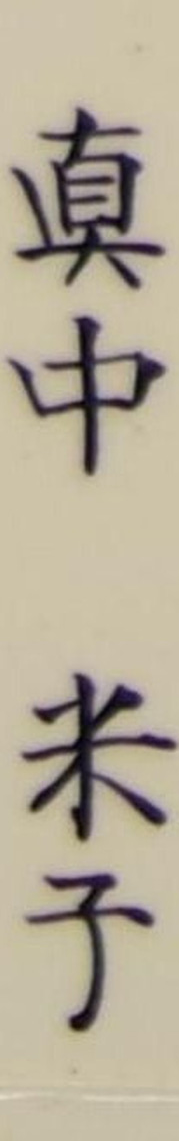真中米子
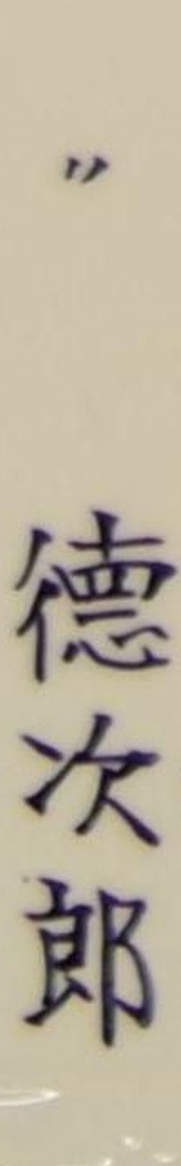徳次郎
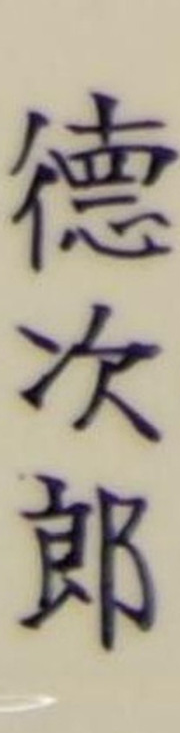徳次郎
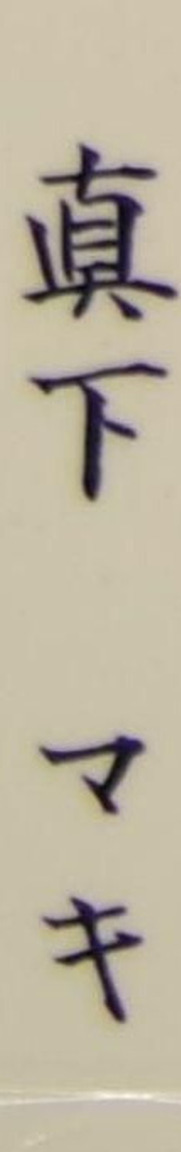真下マキ

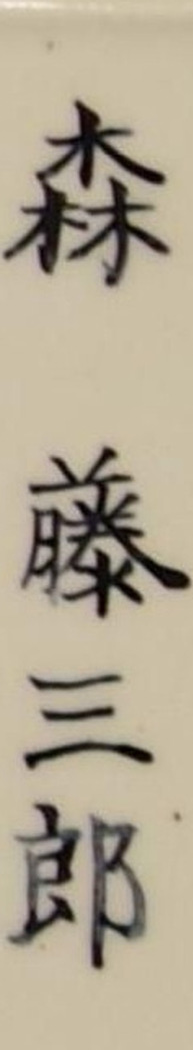森藤三郎
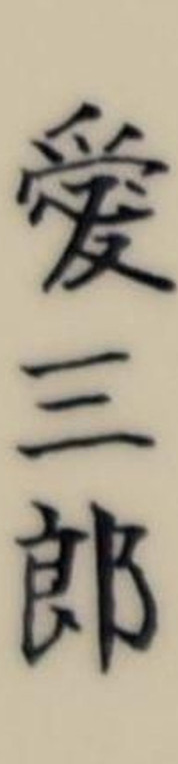愛三郎
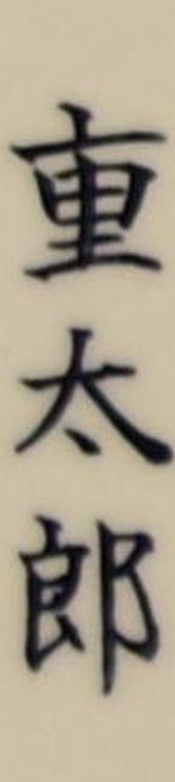重太郎
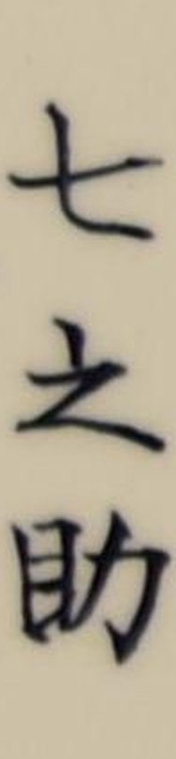七之助
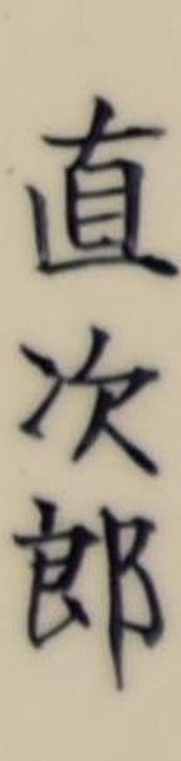直次郎
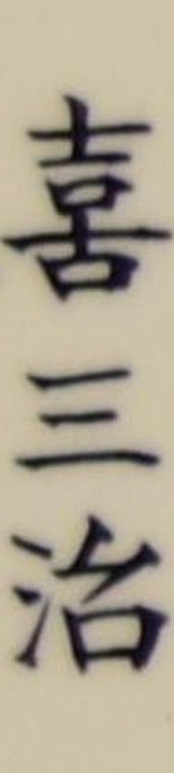喜三治
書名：A~D
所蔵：koyasan kongobuji
